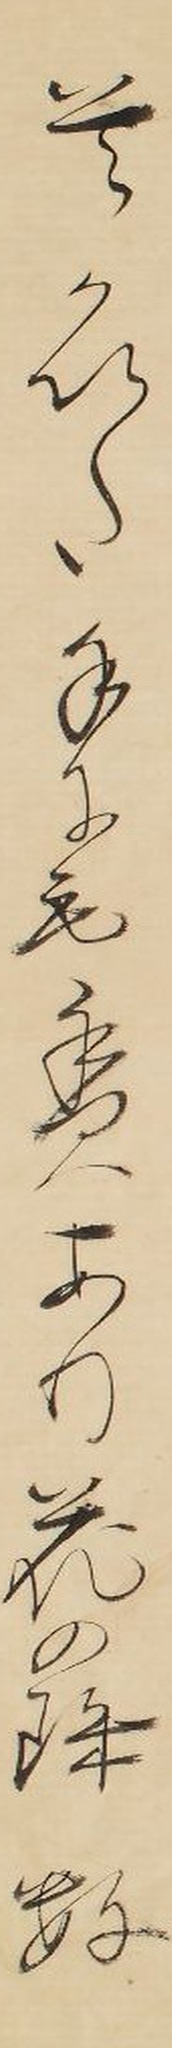首かいた手にも香はあり花の珠数
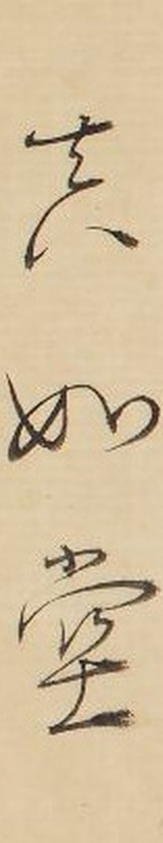真如堂

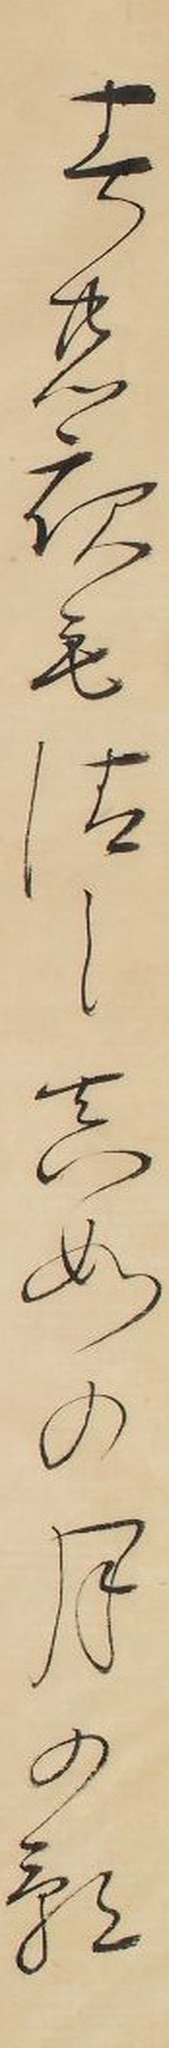春の夜も清し真如の月の影
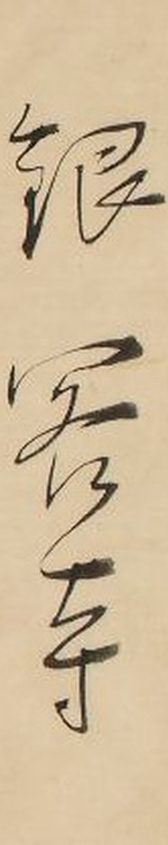銀閣寺
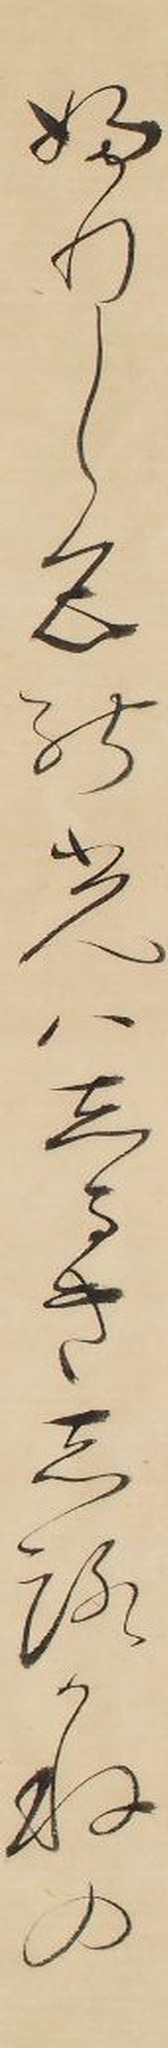ふりし名の光はしるきしろかねの
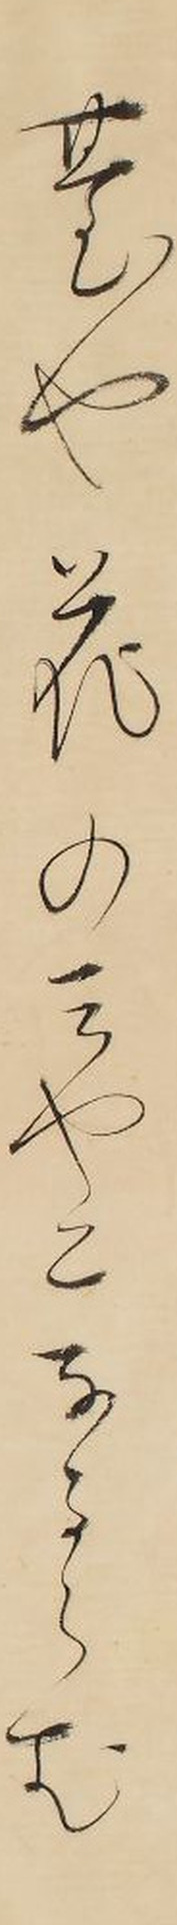台や花のみやこなるらむ
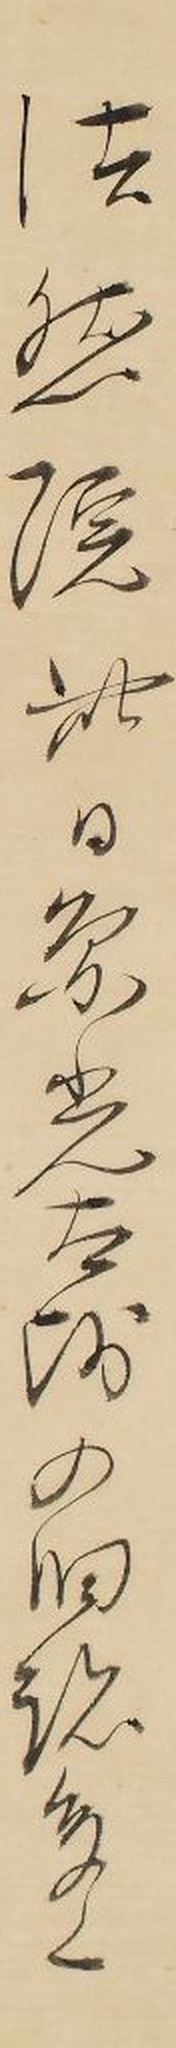法然院此日円光大師の旧跡多く
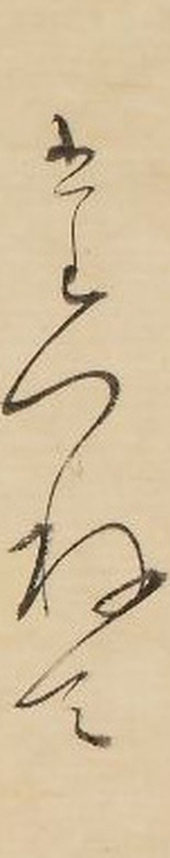たつねて
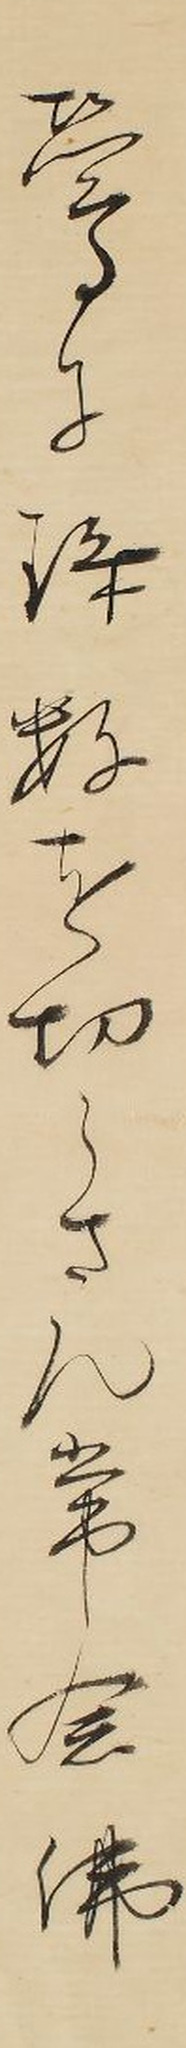鶯に珠数を切らさん常念仏
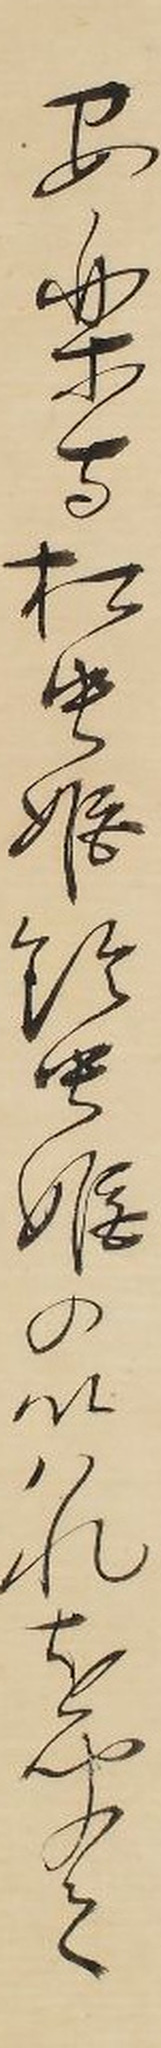安楽寺松虫姫鈴虫姫のいはれを聞て
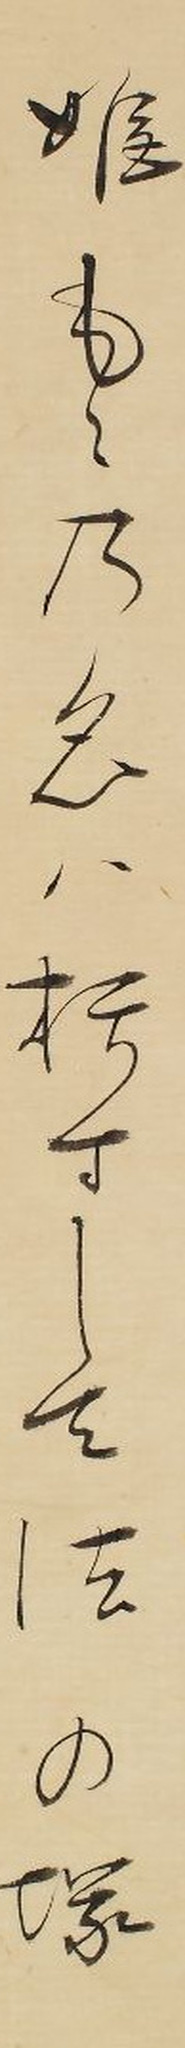姫もゝの名は朽すして法の塚
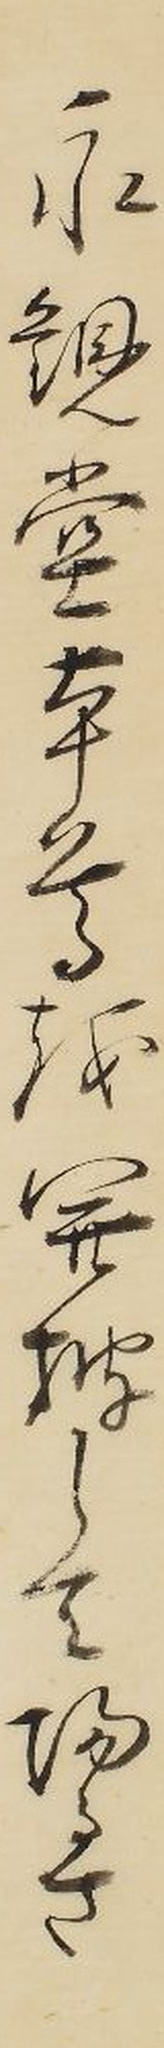永観堂本尊を開披して帰るさ
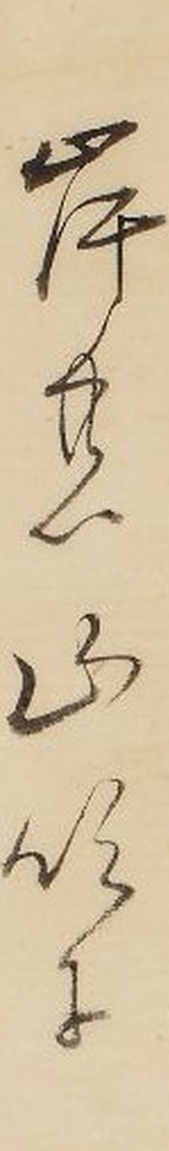岸の山吹に
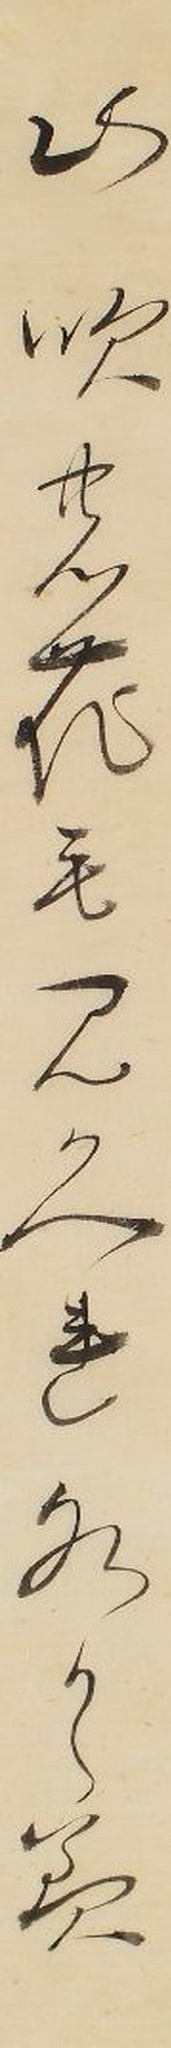山吹の花も見かへれ水かゝみ
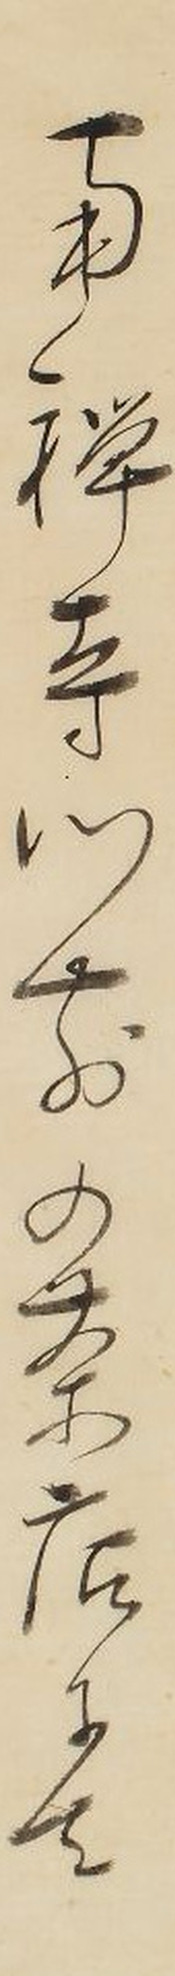南禅寺門前の茶店にて
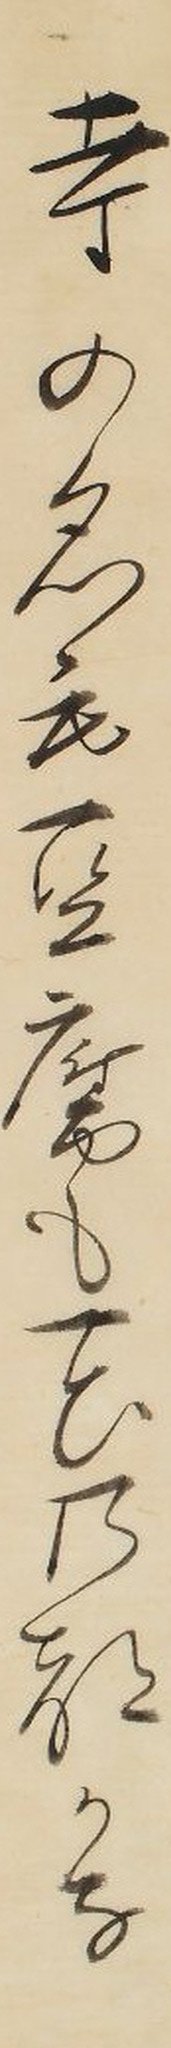寺の名も豆腐も花の都かな
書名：花土産
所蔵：徳島県立図書館
